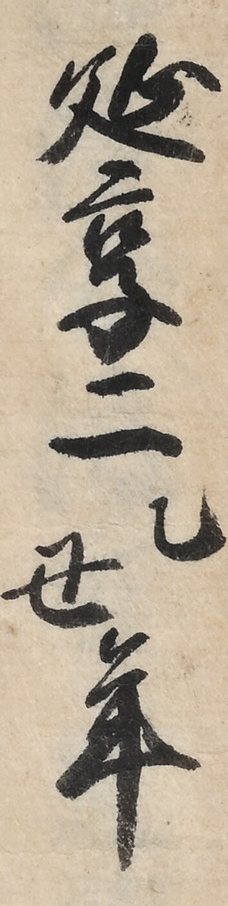延享乙丑年
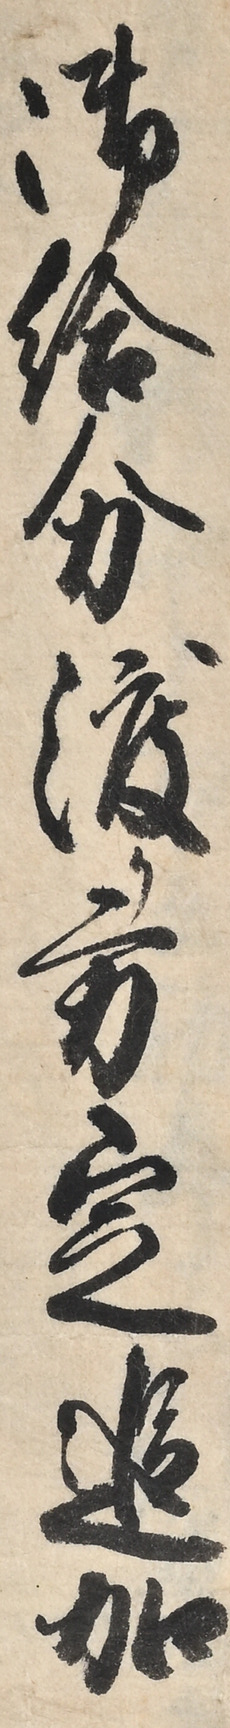御給分渡リ方定追加
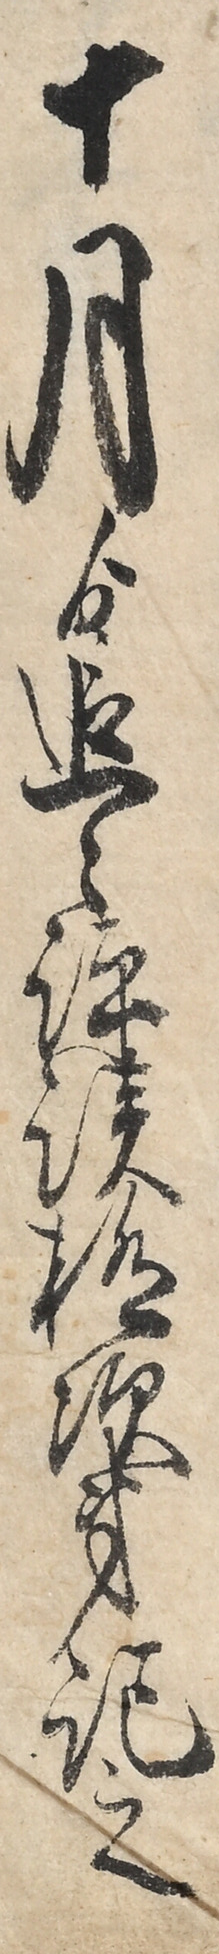十月ゟ追々評談極次第記之

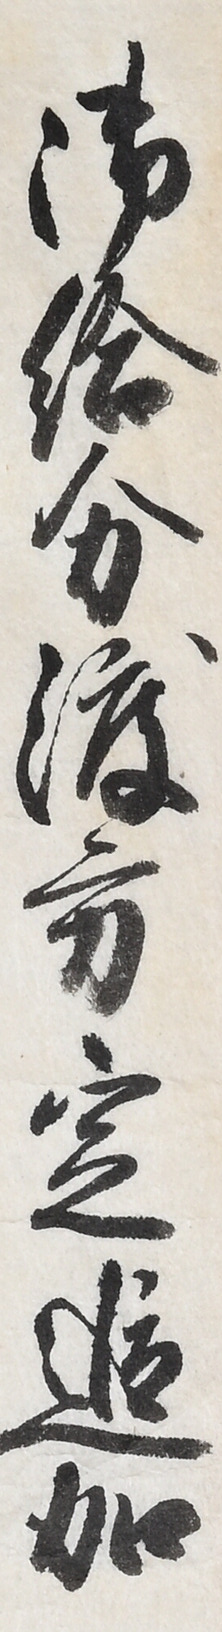御給分渡方定追加
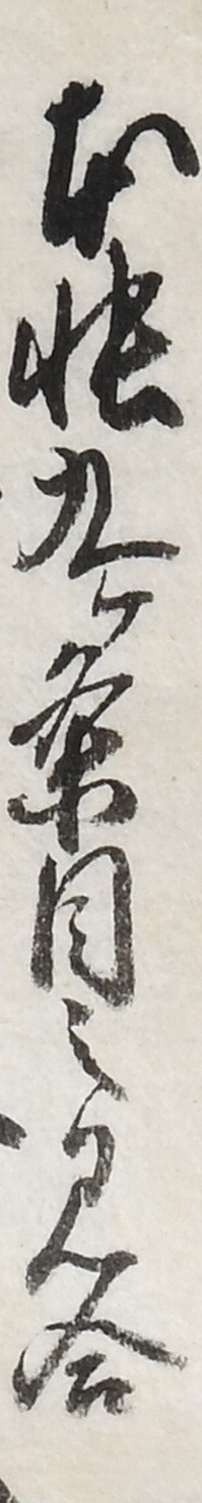本帳九ヶ条目之見合
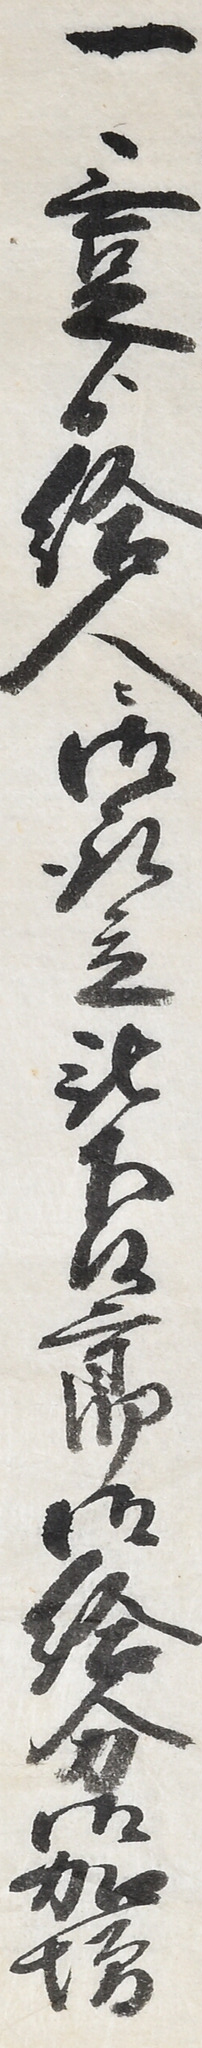一無足ゟ給人ニ御取立被下候節御給分御加増
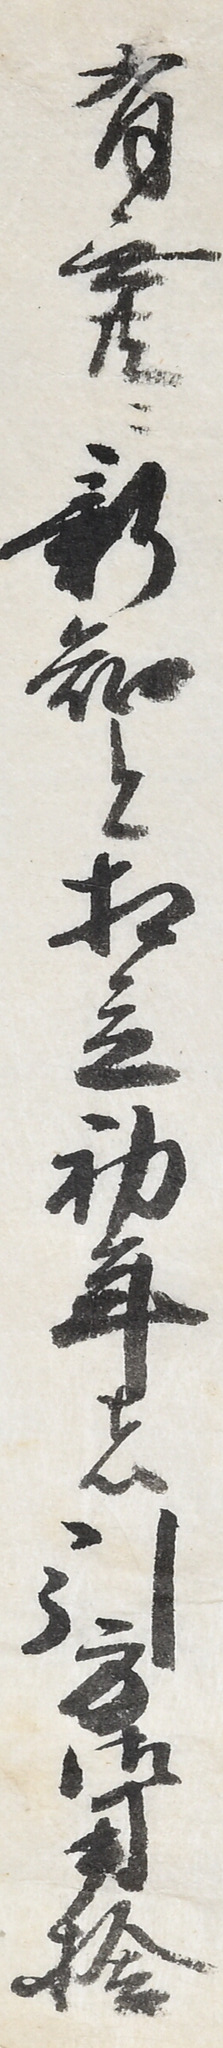有無共ニ新知と相立初年は引方御用捨
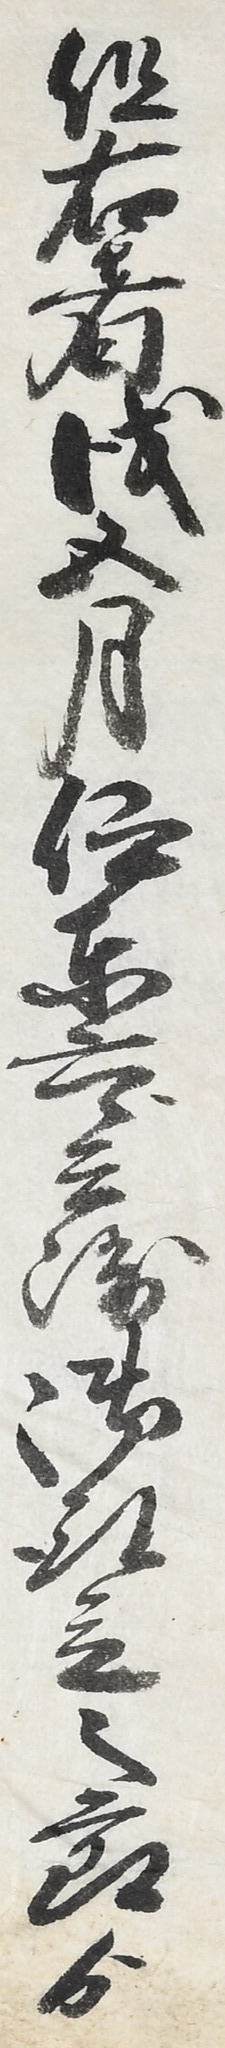但右は戌五月伊東六兵衛御取立之節ゟ
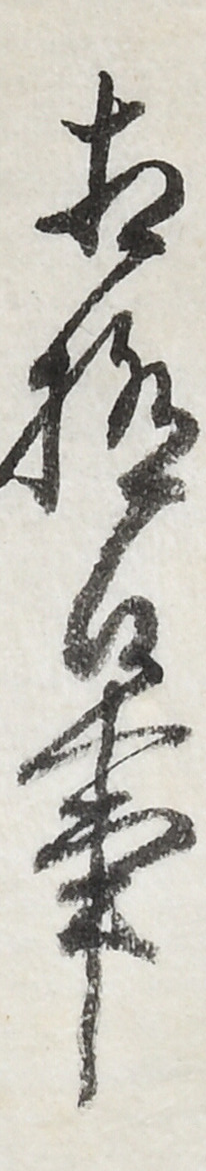相極候事
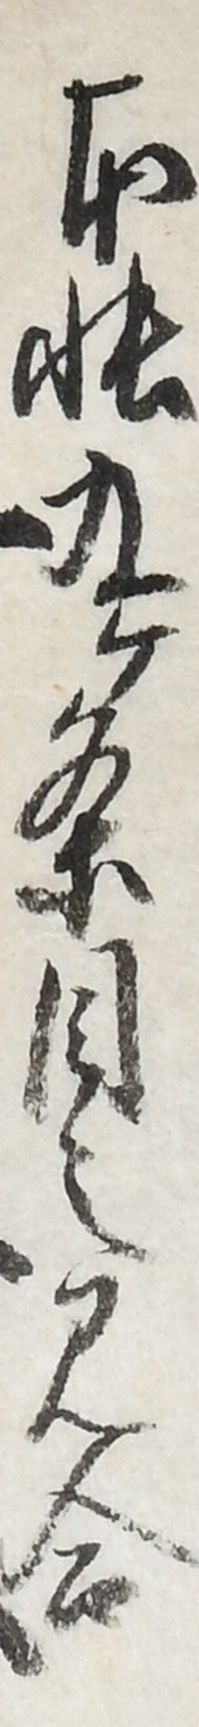本帳九ヶ条目之見合
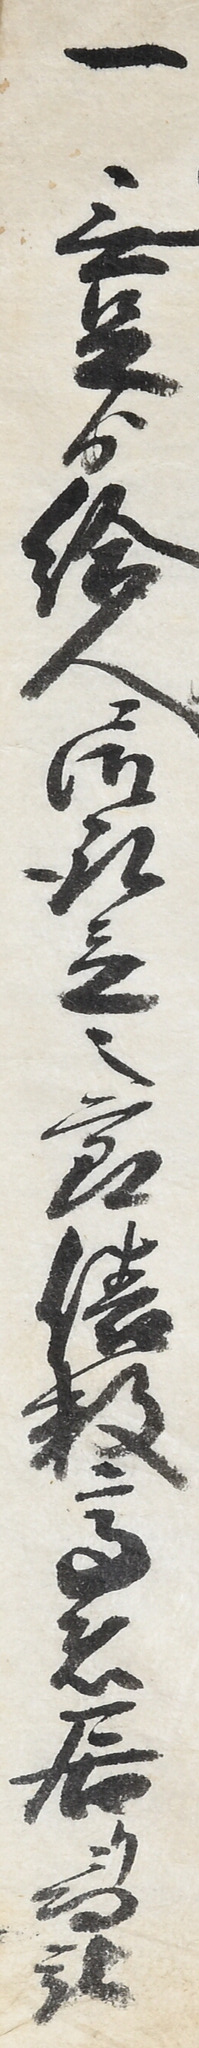一無足ゟ給人ニ御取立之節俵数高は居リニ而被

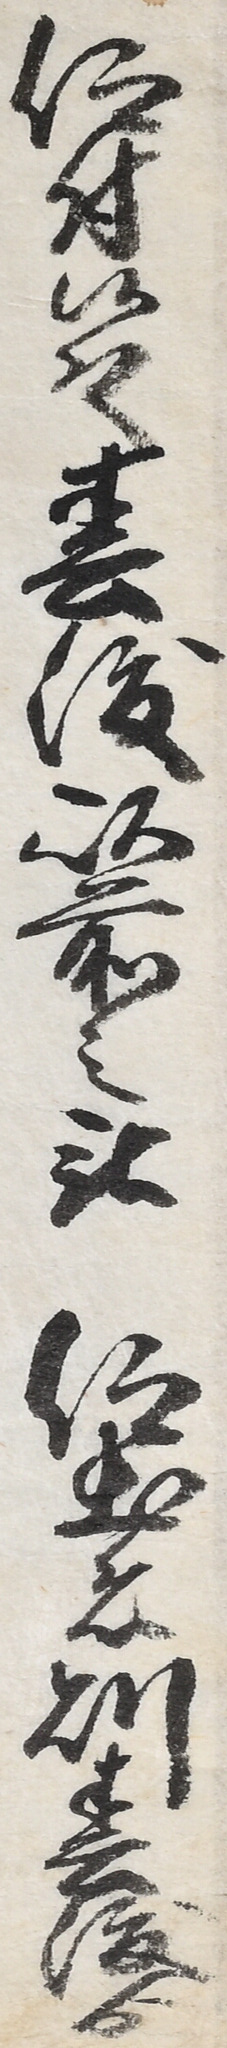仰付候ハヽ春後以前之被仰出は則春後ゟ
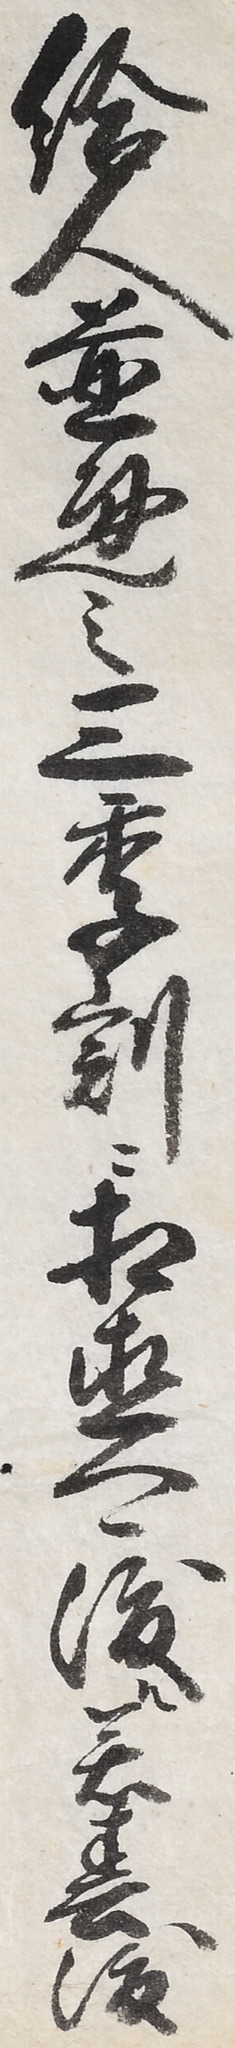給人並通之三季割ニ相直可渡ル若春後
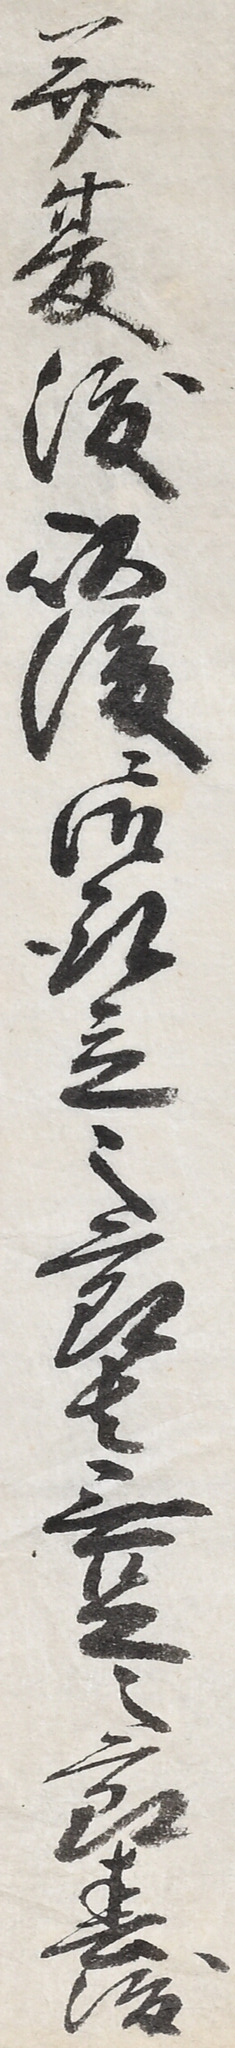并夏後以後ニ御取立之節は無足之節春後
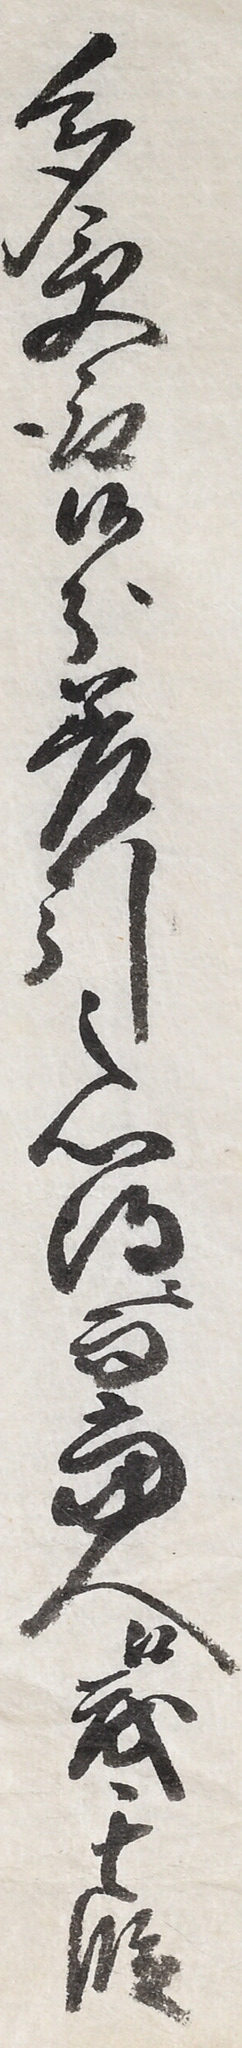多受取候分差引之心得ニ而当人江も其段
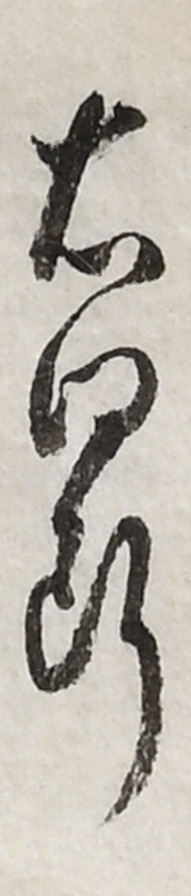右同断
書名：御給分渡り方定追加
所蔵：伊那市立高遠町図書館・合同会社AMANE
